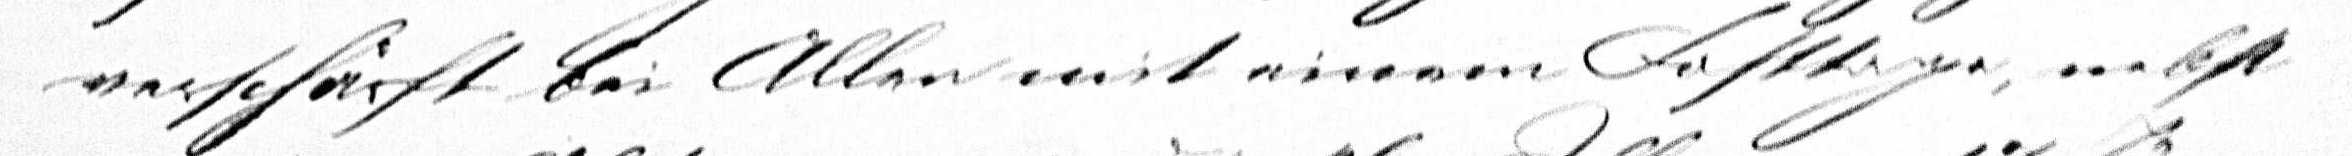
verschärft bei Allen mit einem Fasttage, nebst
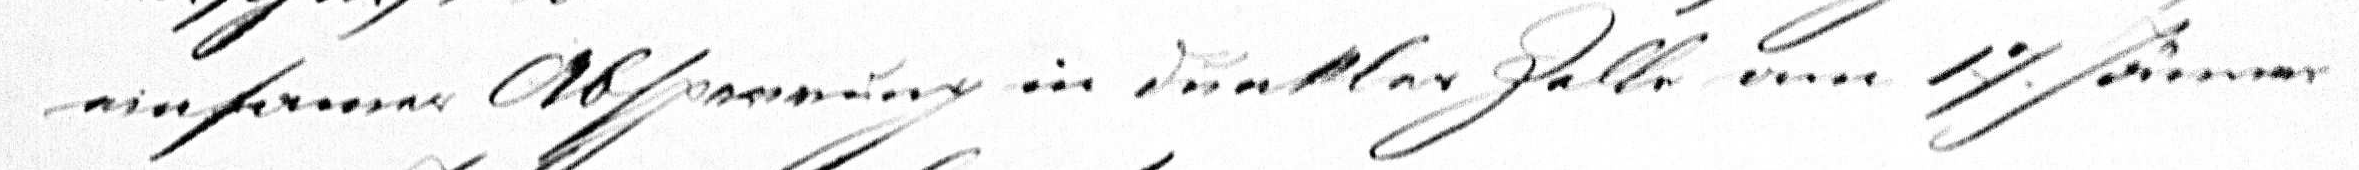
einsamer Absperrung in dunkler Zelle am 17. Jänner
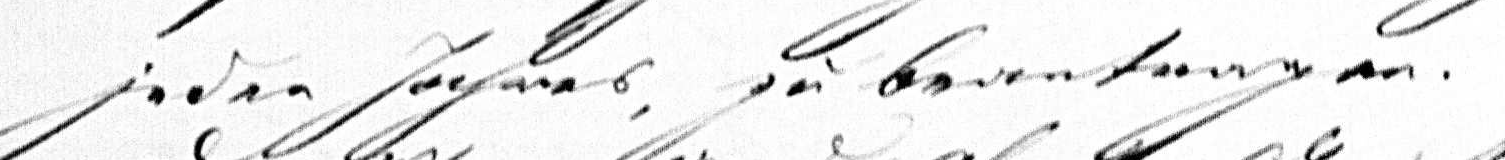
jeden Jahres, zu beantragen.
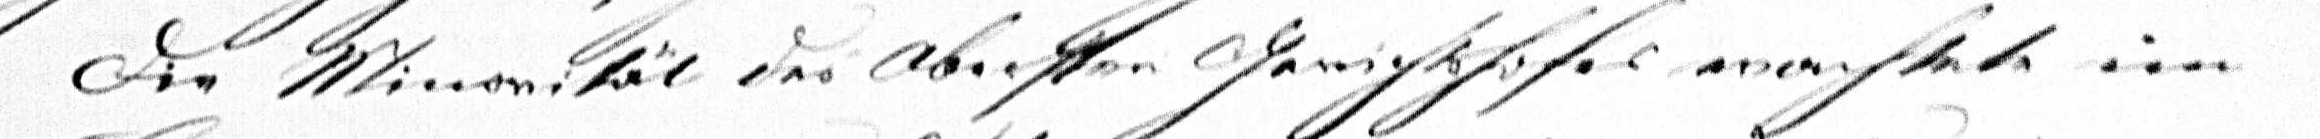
Die Minorität des obersten Gerichtshofes erachtete im
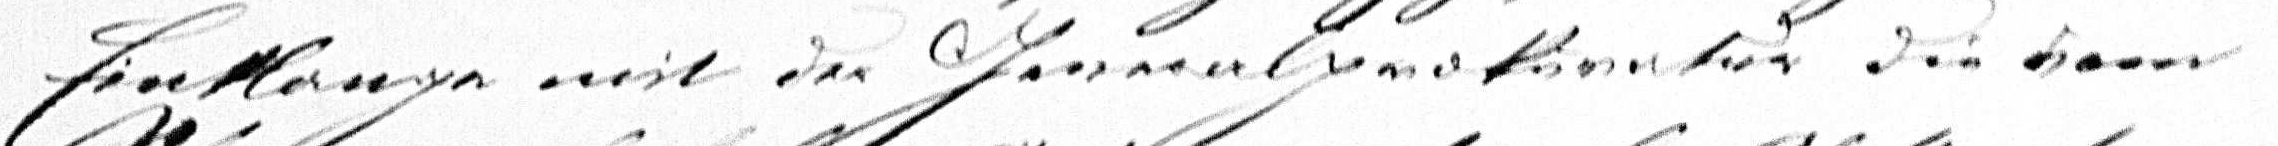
Einklange mit der Generalprokuratur die vom
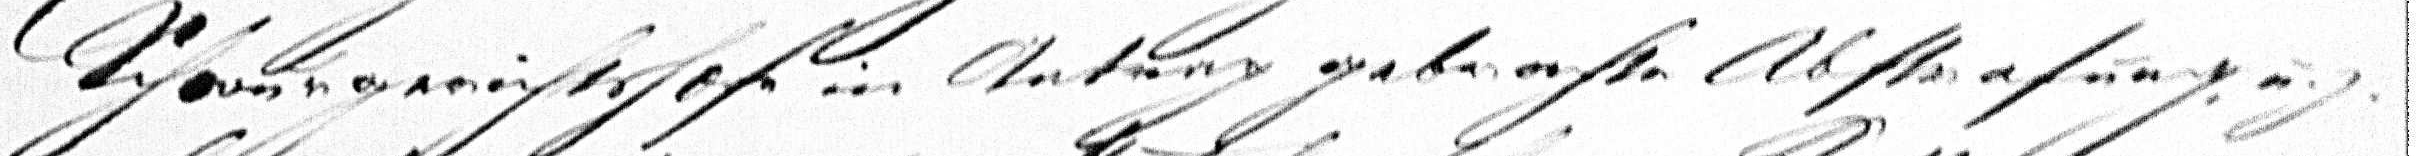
Schwurgerichtshofe in Antrag gebrachte Abstrafung u.z.
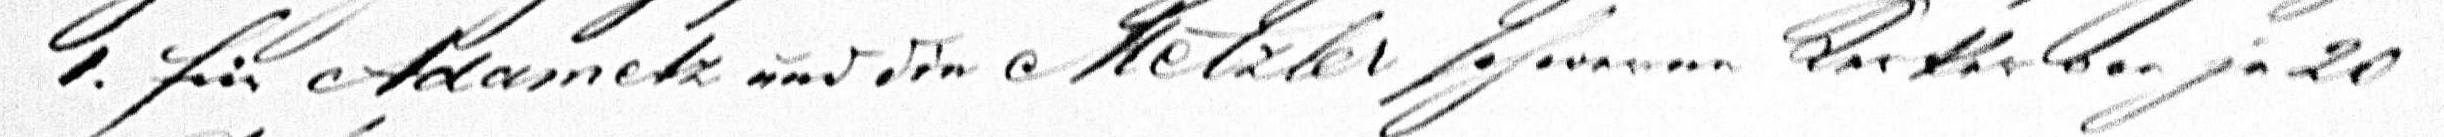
1. für Adametz und die Metzler schweren Kerker von je 20
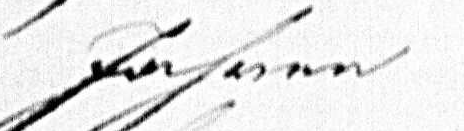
Jahren
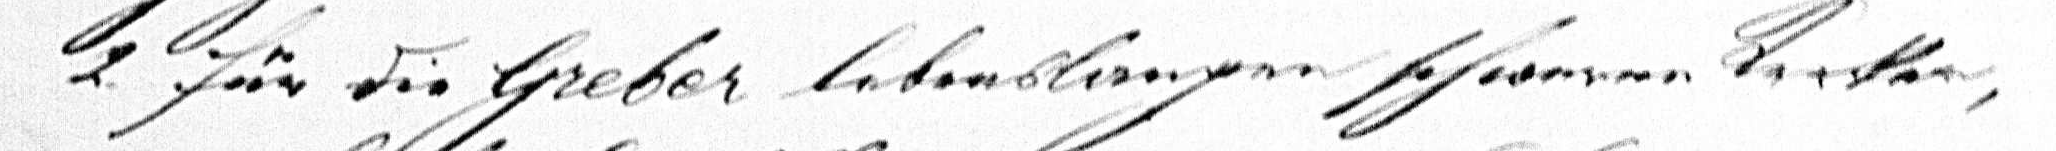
2. für die Greber lebenslangen schweren Kerker,
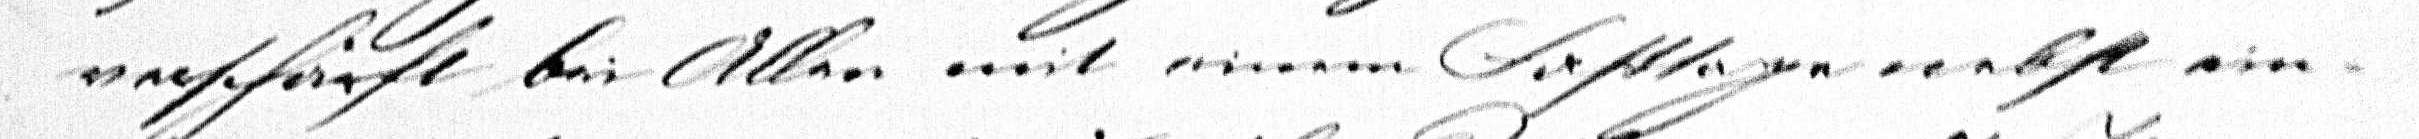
verschärft bei Allen imt einem Fasttage nebst ein¬
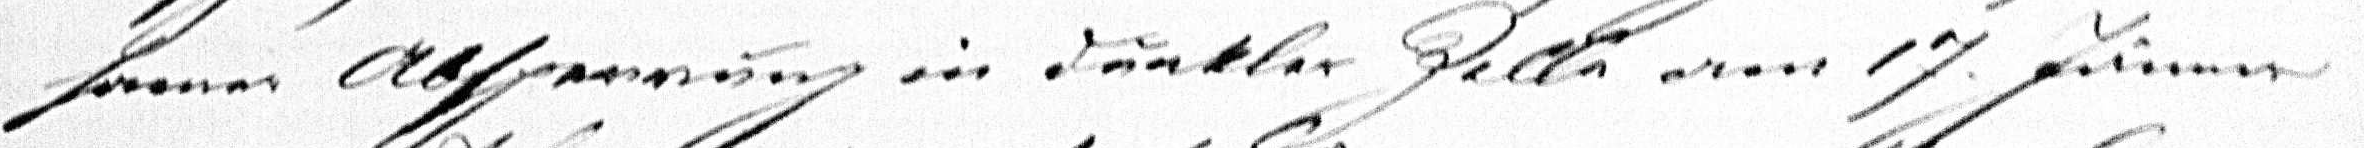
samer Absperrung in dunkler Zelle am 17. Jänner
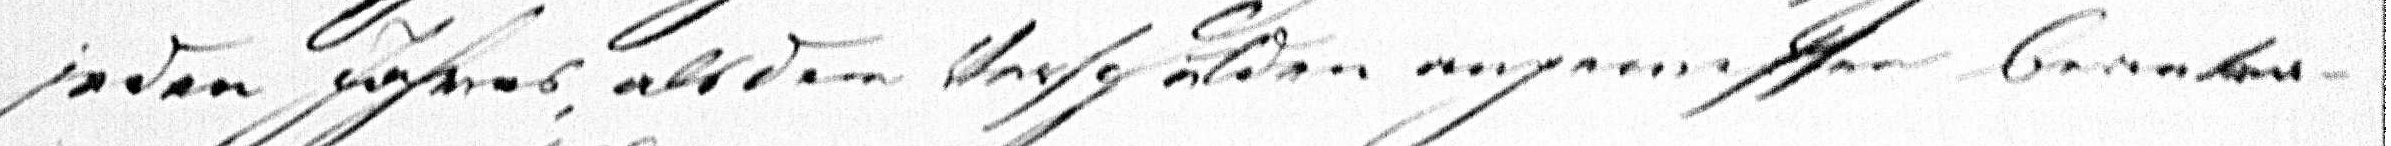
jeden Jahres, als dem Verschulden angemessen beantra¬
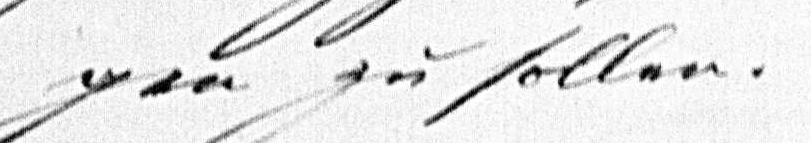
gen zu sollen.
